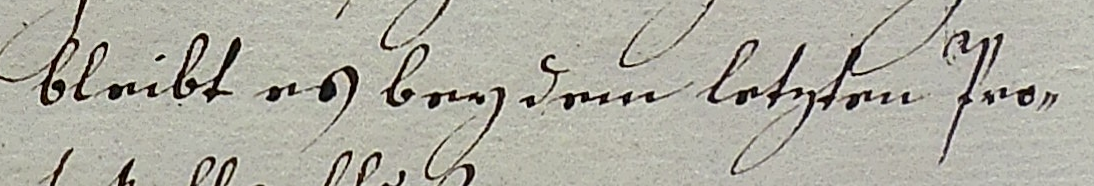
bleibt es bey dem letzten Pro¬
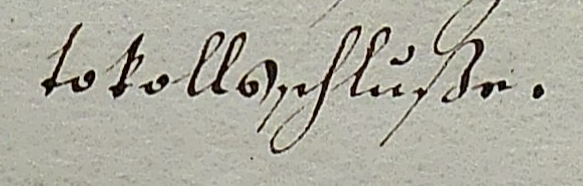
tokollschluße.
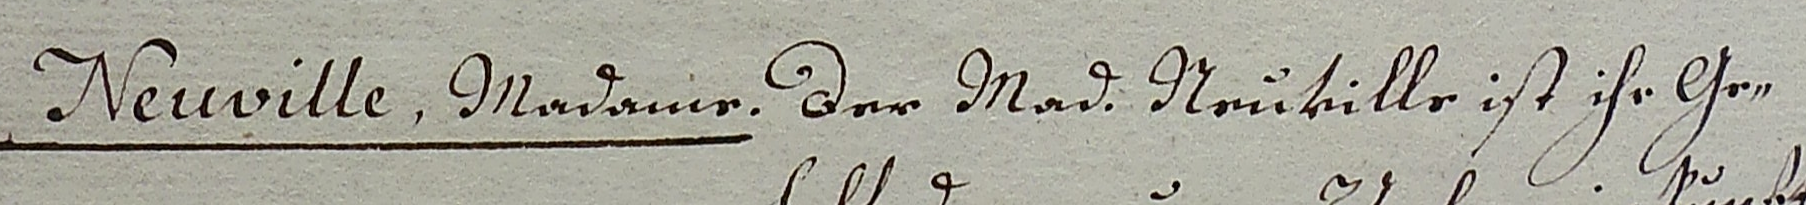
Neuville, Madame. Der Mad. Neuville ist ihr Ge¬
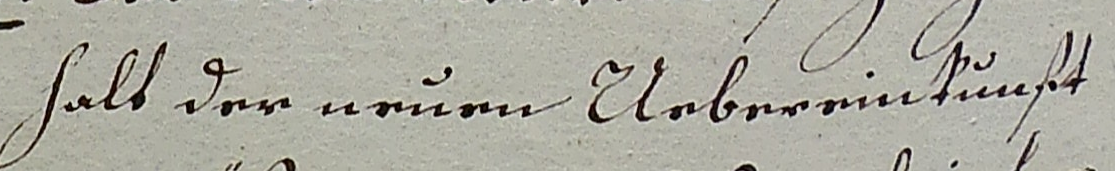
halt der neuen Uebereinkunft
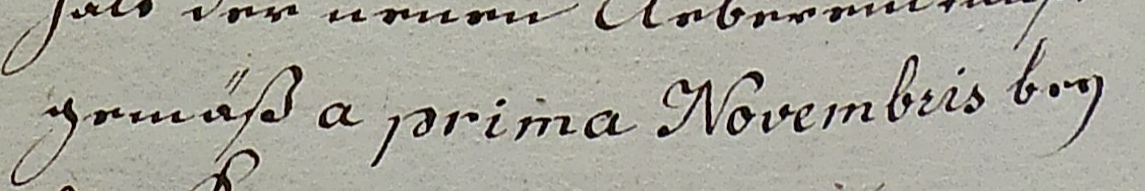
gemäß a prima Novembris bey
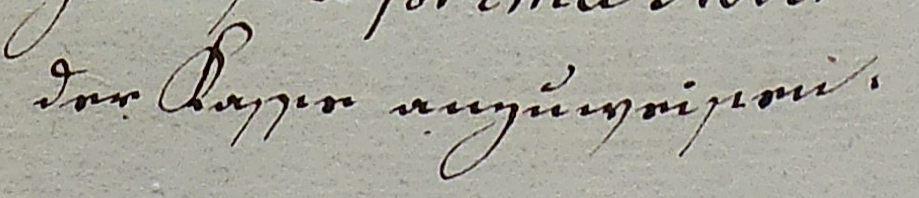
der Kasse anzuweisen.
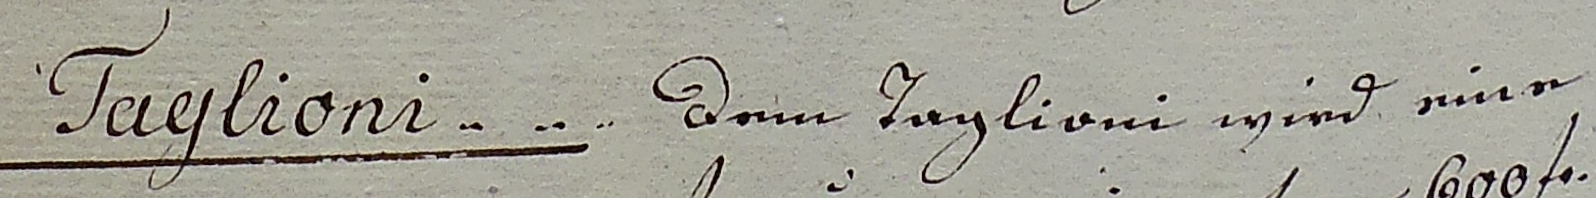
Taglioni .. .. .. Dem Taglioni wird eine
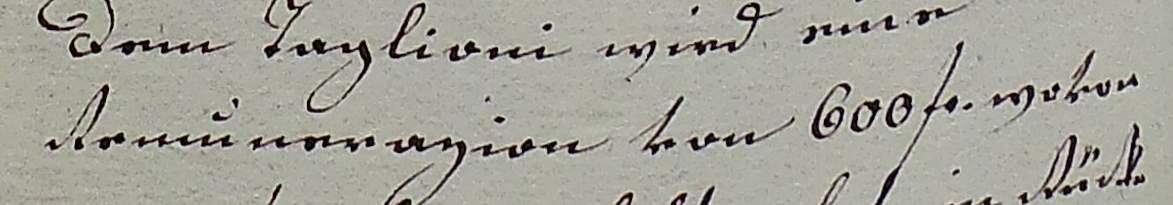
Remunerazion von 600fr. wovon
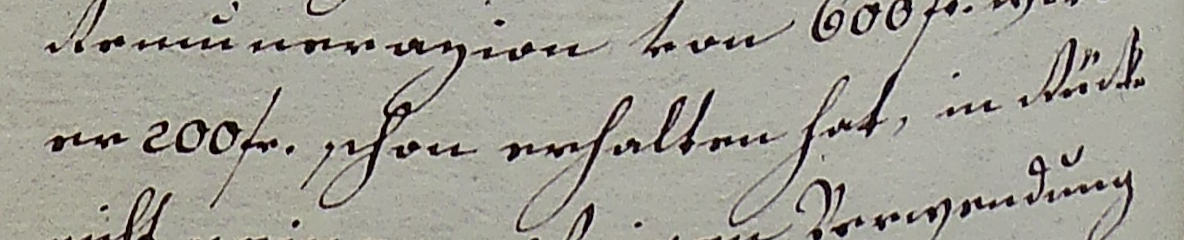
er 200fr. schon erhalten hat, nm Rück¬
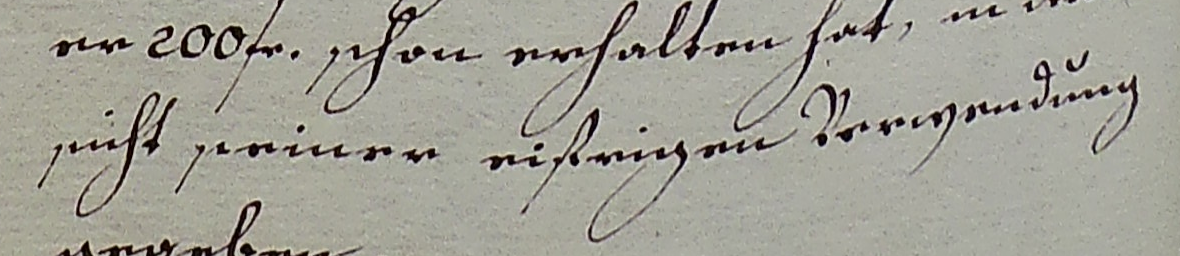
sicht seiner eifrigen Verwendung
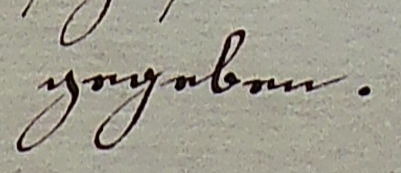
gegeben.
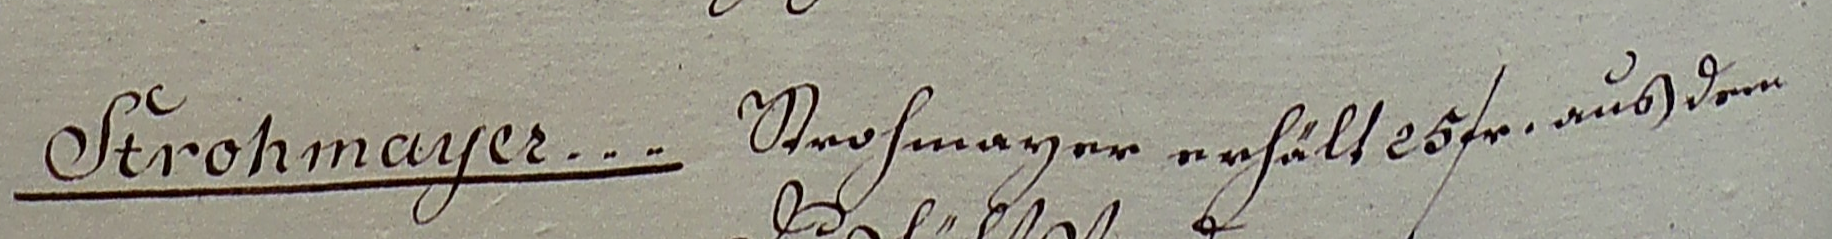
Strohmayer . . .. Strohmayer erhält 25fr. aus dem
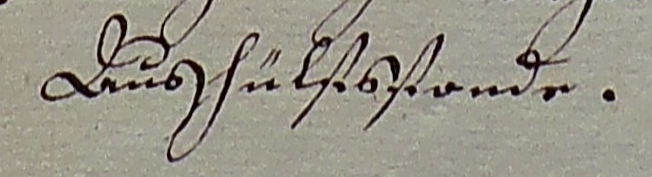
Aushülfsfonde.
